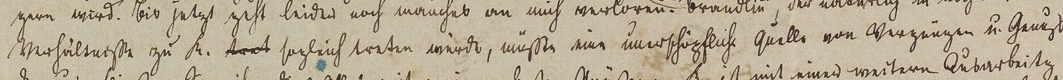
Verhältnisse zu R.tret sogleich treten würde, müßte eine unerschöpfliche Quelle von Vergnügen u. Genuß
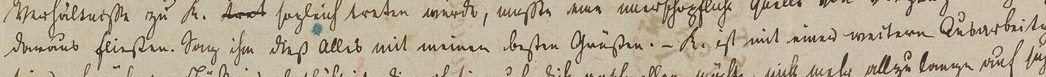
daraus fließen. Sag ihm dieß Alles mit meinen besten Grüßen. – R. ist mit einer weitern Ausarbeitg
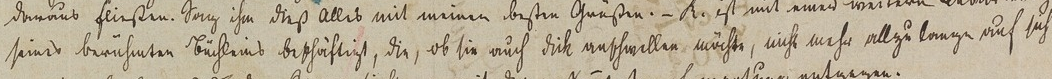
seines berühmten Büchleins beschäftigt, die, ob sie auch dick anschwellen möchte, nicht mehr allzu lange auf sich
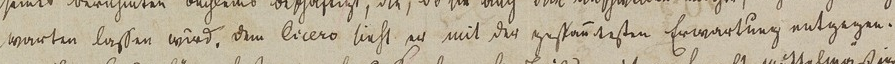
warten lassen wird. Dem Cicero sieht er mit der gespanntesten Erwartung entgegen.
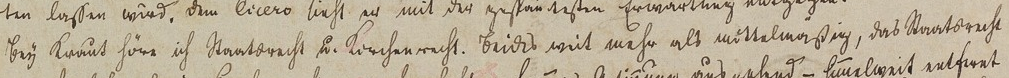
Bey Kraut höre ich Staatsrecht u. Kirchenrecht. Beides weit mehr als mittelmäßig, das Staatsrecht
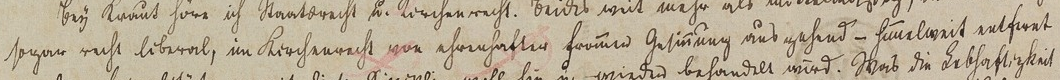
sogar recht liberal, im Kirchenrecht von ehrenhafter frommer Gesinnung aus gehend – himmelweit entfernt
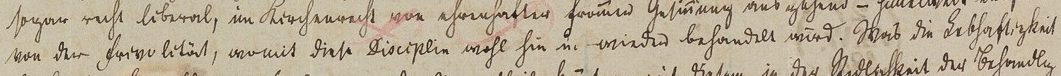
von der Frivolität, womit diese Disciplin wohl hin u. wieder behandelt wird. Was die Lebhaftigkeit
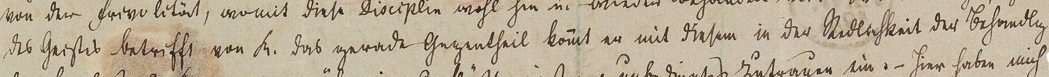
des Geistes betrifft von R. das gerade Gegentheil kommt er mit diesem in der Redlichkeit der Behandlg
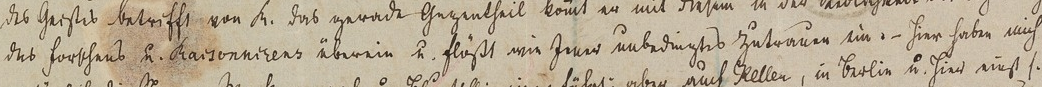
des Forschens u. Raisonnirens überein u. flößt mir Jener unbedingtes Zutrauen ein. – Hier haben mich
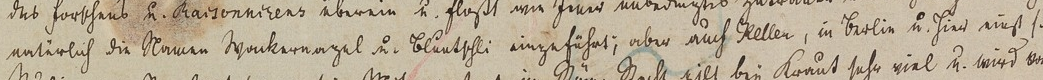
natürlich die Namen Wackernagel u. Bluntschli eingeführt; aber auch Keller, in Berlin u. Hier einst s.
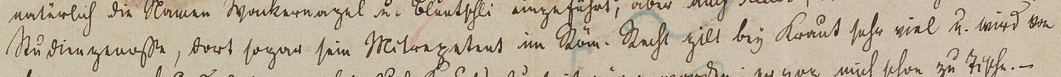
Studiengenosse, dort sogar sein Mitrepetent im Röm. Recht gilt bey Kraut sehr viel u. wird von
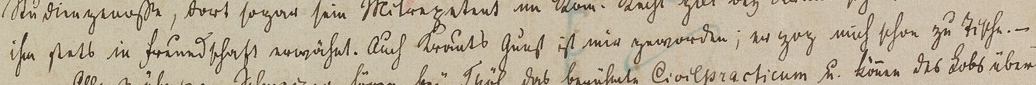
ihm stets in Freundschaft erwähnt. Auch Krauts Gunst ist mir geworden; er zog mich schon zu Tische. –
